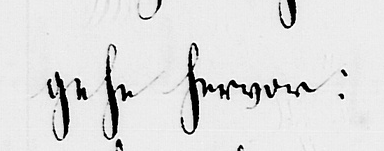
gehe hervor:
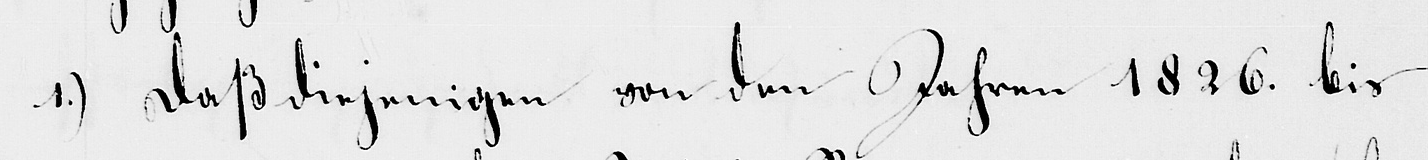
1.) Daß diejenigen von den Jahren 1826. bis
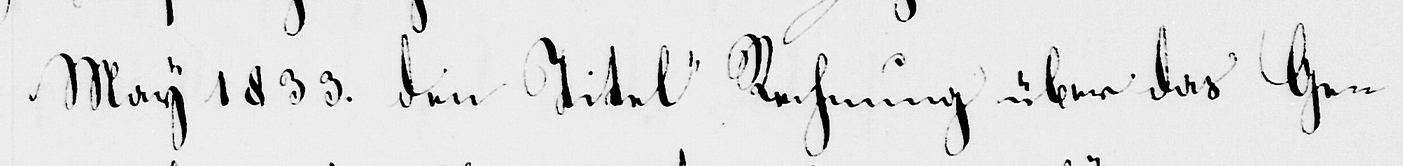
May 1833. den Titel „Rechnung über das Ge¬
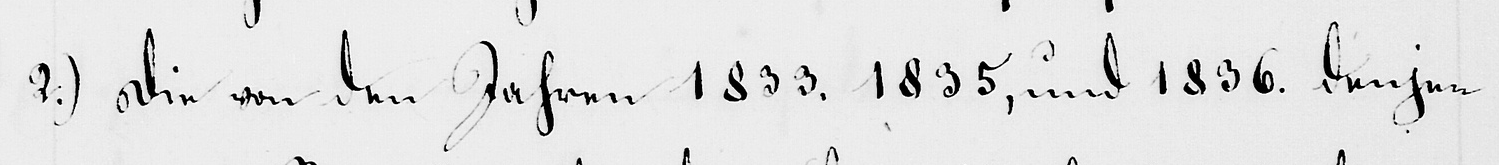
2.) Die von den Jahren 1833. 1835, und 1836. denje¬
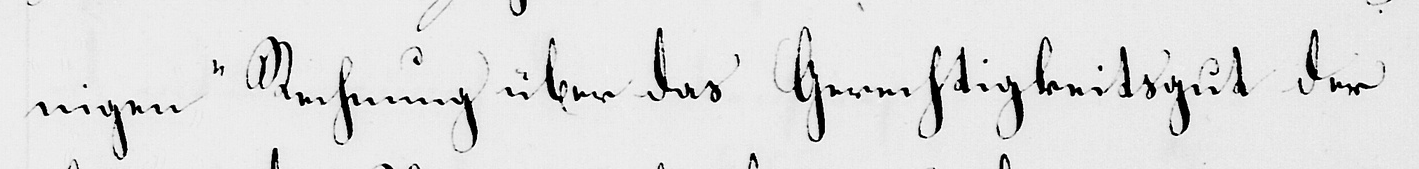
nigen „Rechnung über das Gerechtigkeitsgut der
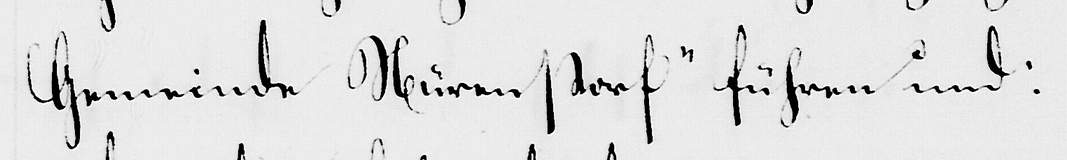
Gemeinde Nürenstorf“ führen und:
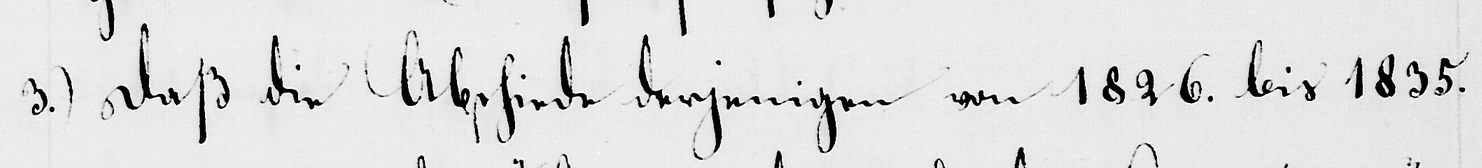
3.) Daß die Abschiede derjenigen von 1826. bis 1835.
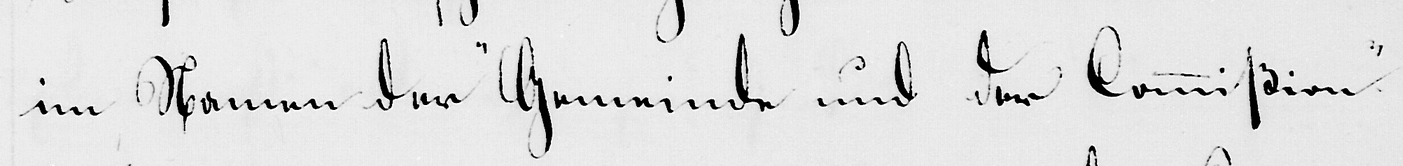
im Namen der „Gemeinde und der Commißion“
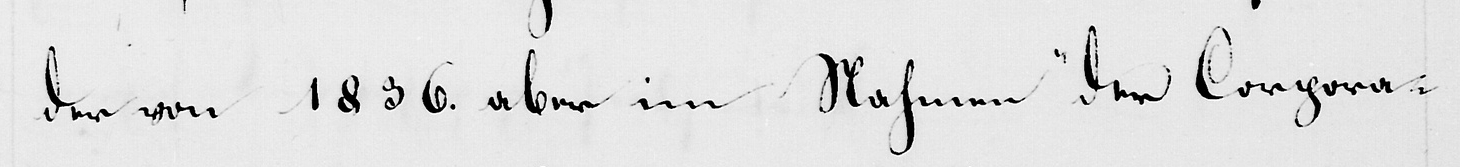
der von 1836. aber im Nahmen „der Corpora¬
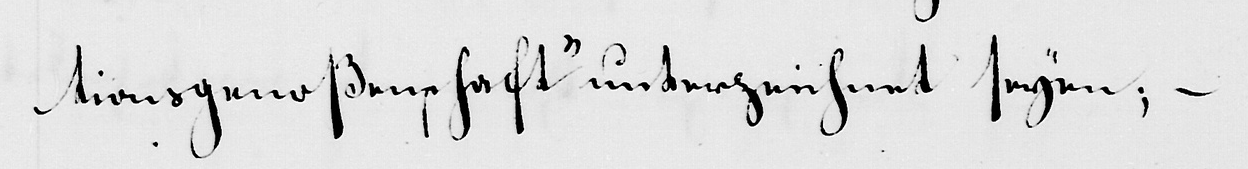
tionsgenoßenschaft“ unterzeichnet seyen; –
